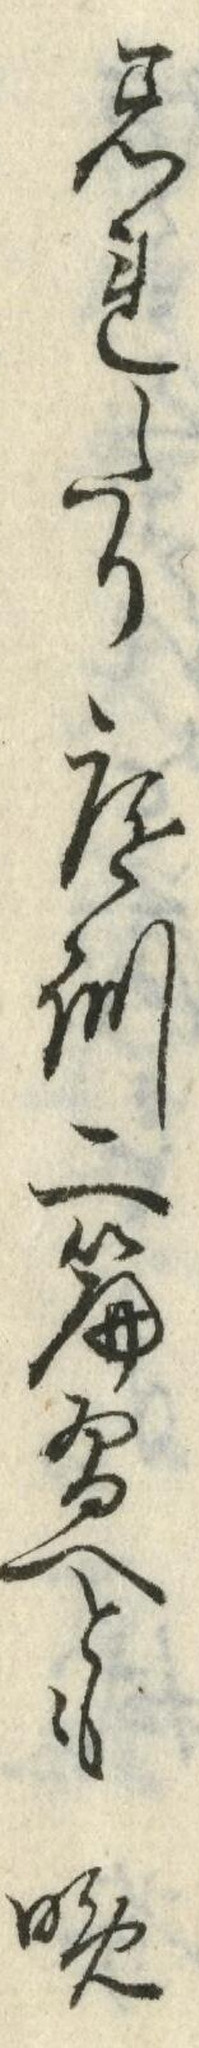着れたり庭訓二篇習へとも晩
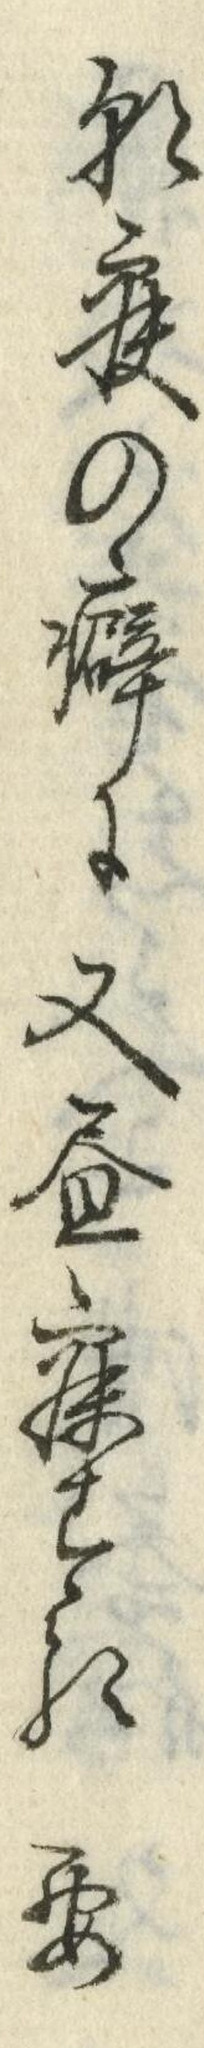朝寝の癖に又昼寝する要
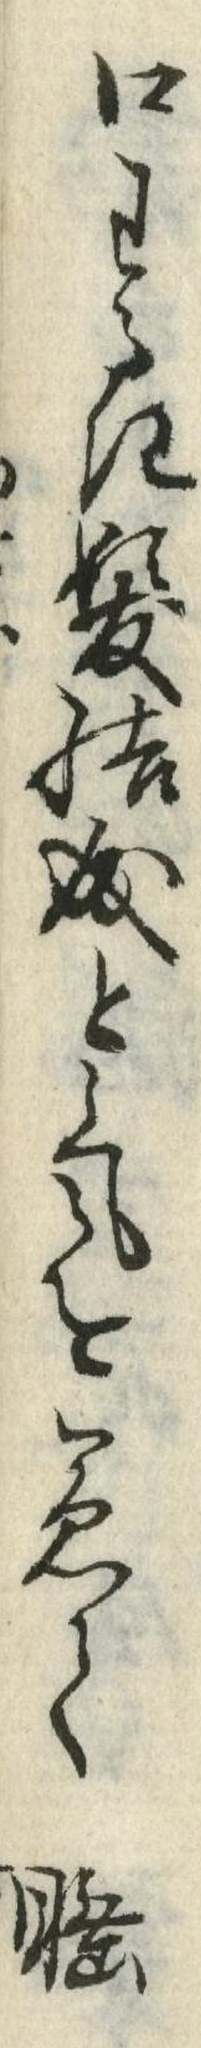口わろき髪結成と気を着て睡

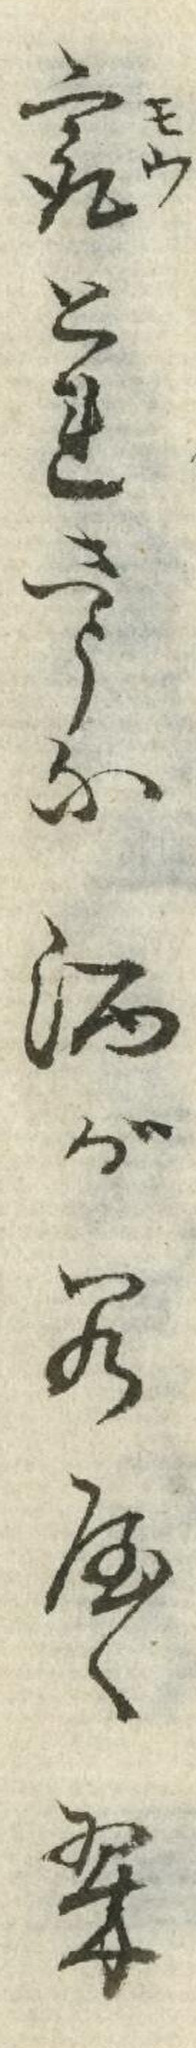最とれさうな酒が若やく翠
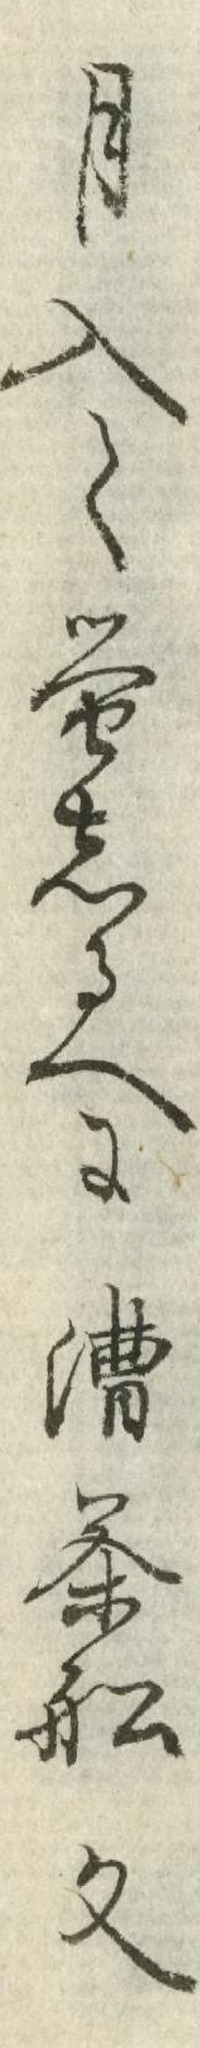月入て蛍しるへに漕茶船文
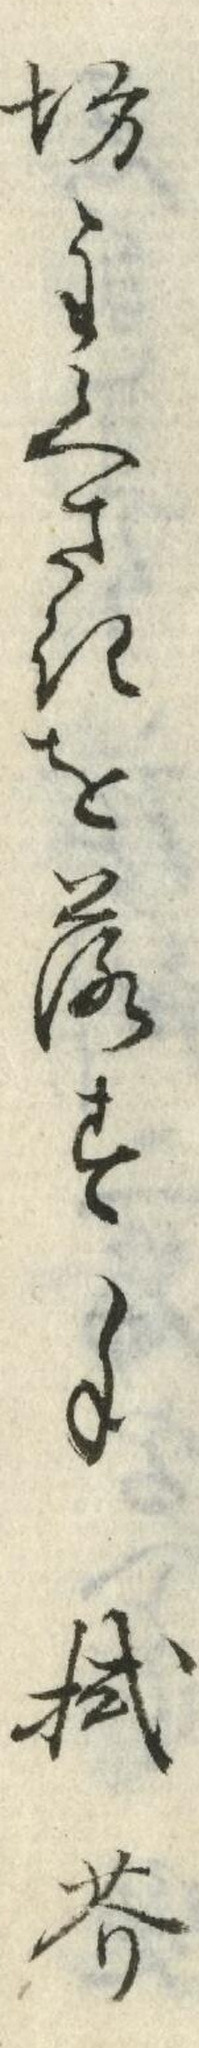坊主くさきを落す手拭芥
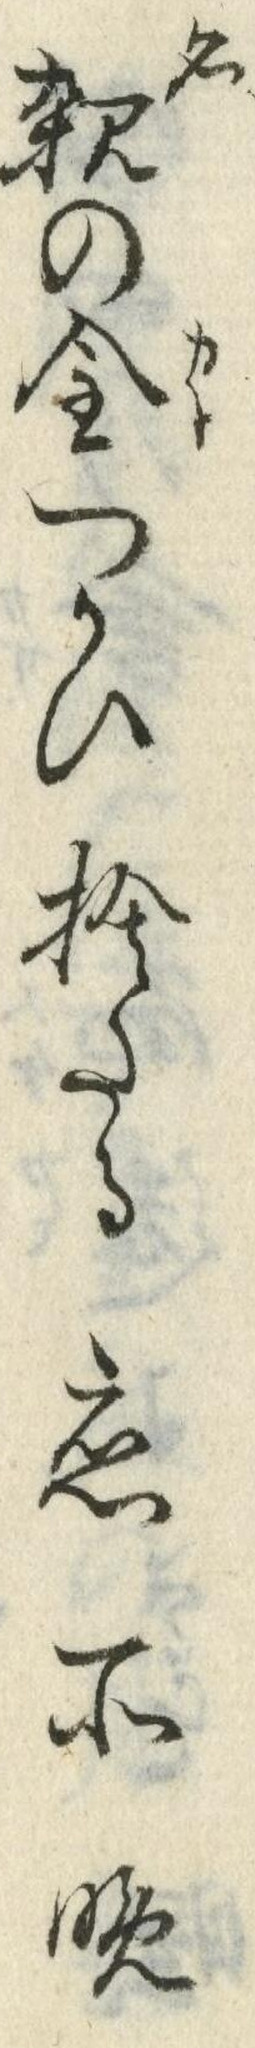親の金つかひ捨たる恋所晩
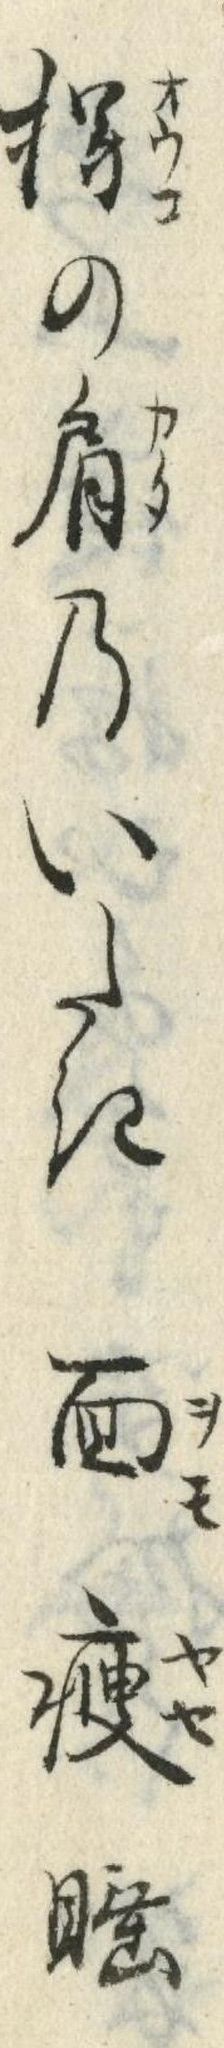枴の肩のいたき面痩睡
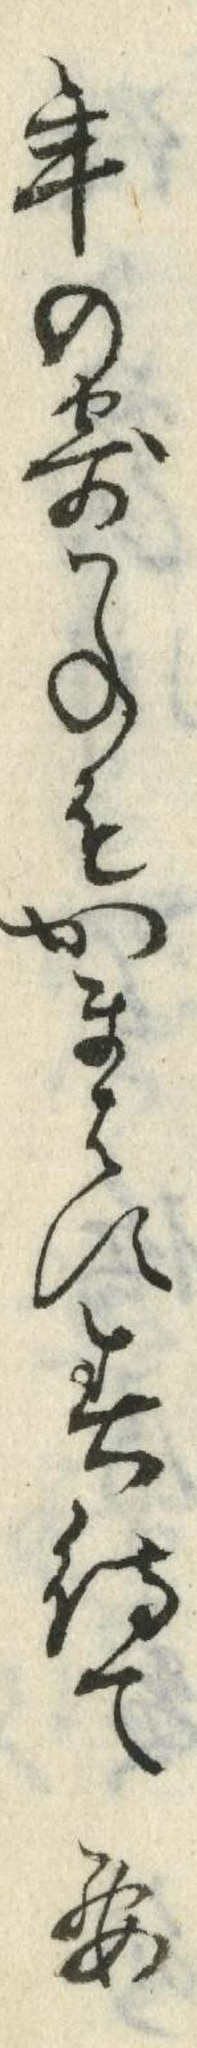年の寄ハネもかまはす春待て要
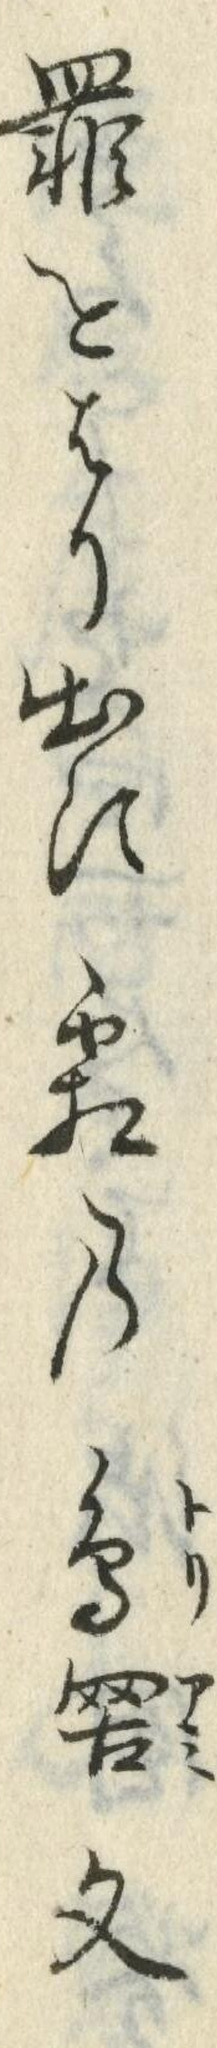罪をはり出す霜の鳥網文
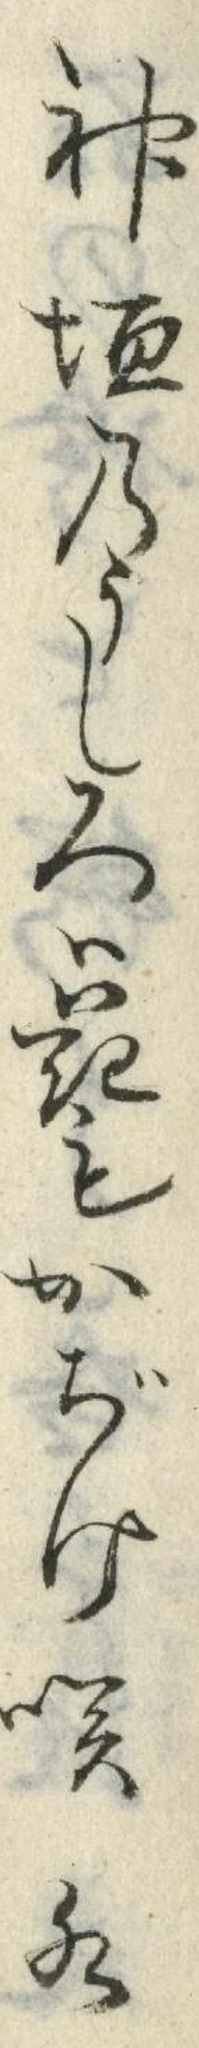神垣のうしろハ花もかぢけ咲水
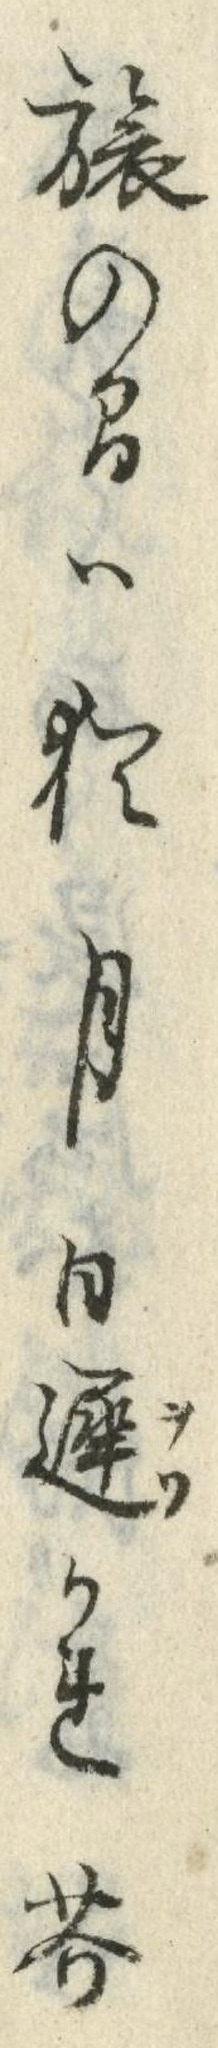旅の間ハ猶月日遅かれ芥
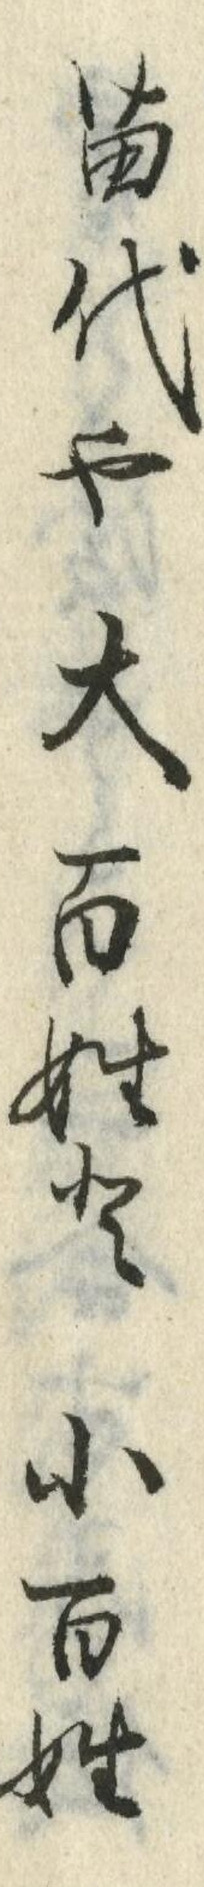苗代や大百姓と小百姓
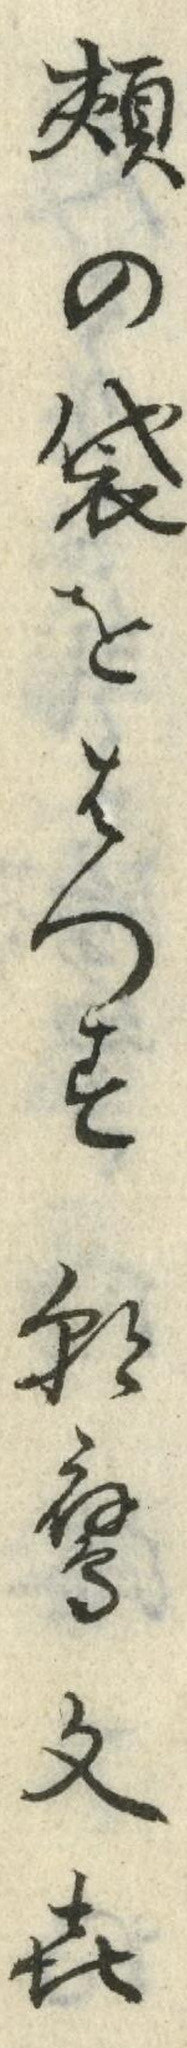頬の袋をはつす朝鷹文喜
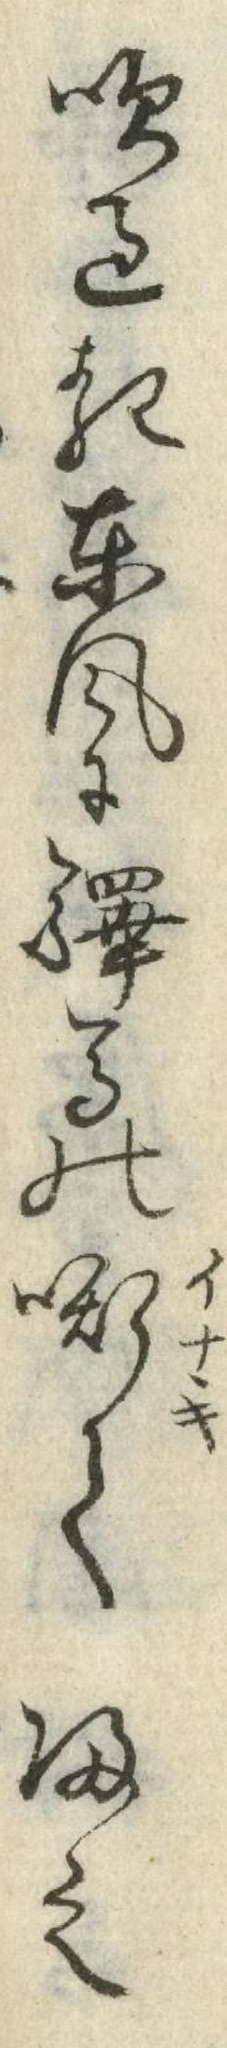吹過る東風に駅馬の嘶て帰之

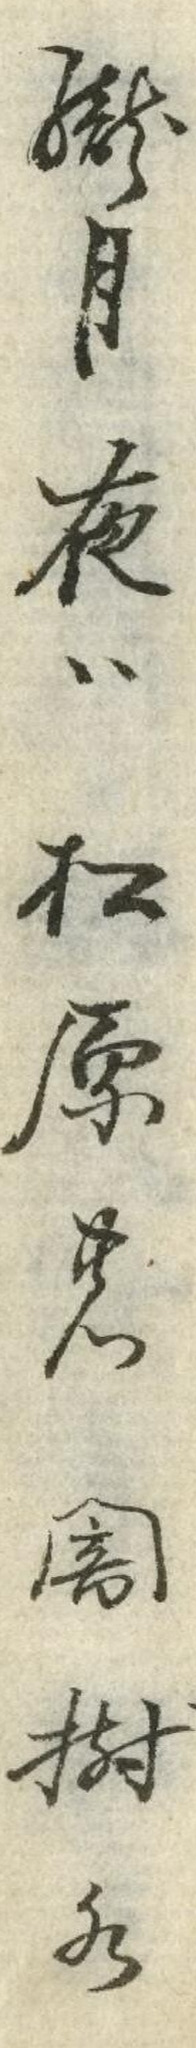朧月夜ハ松原の闇樹水
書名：誹諧　能登釜
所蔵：Ishikawa Prefectural Library
